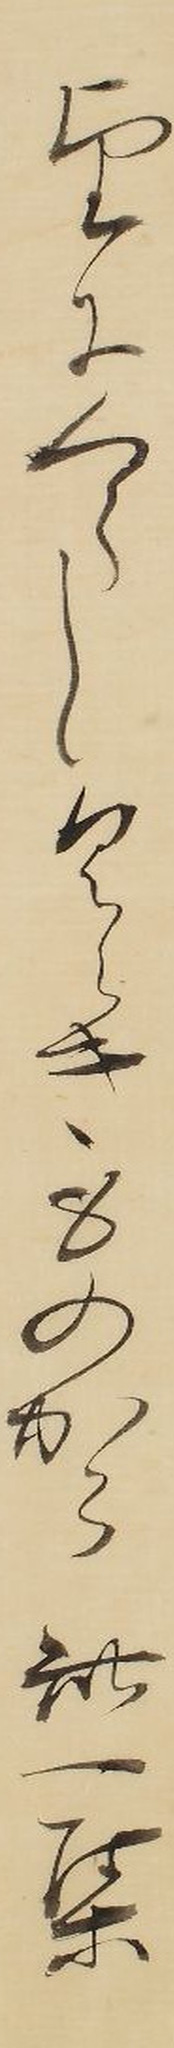望にくらしくらきものから此一集を
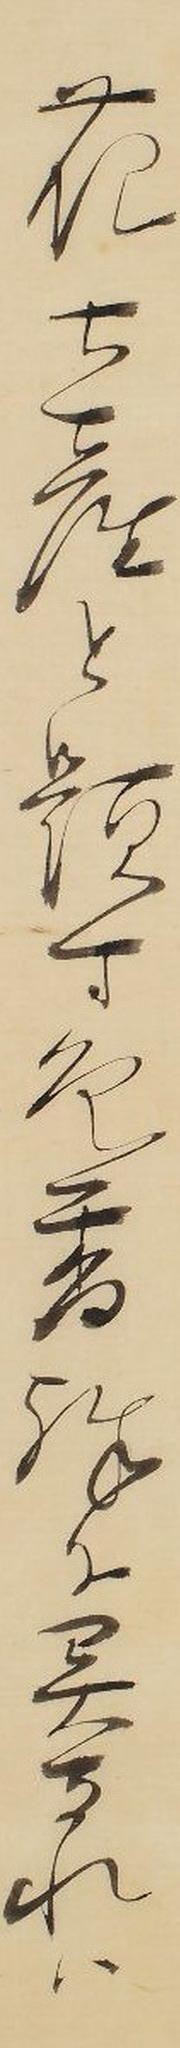花土産と題す色香殊に異なれは
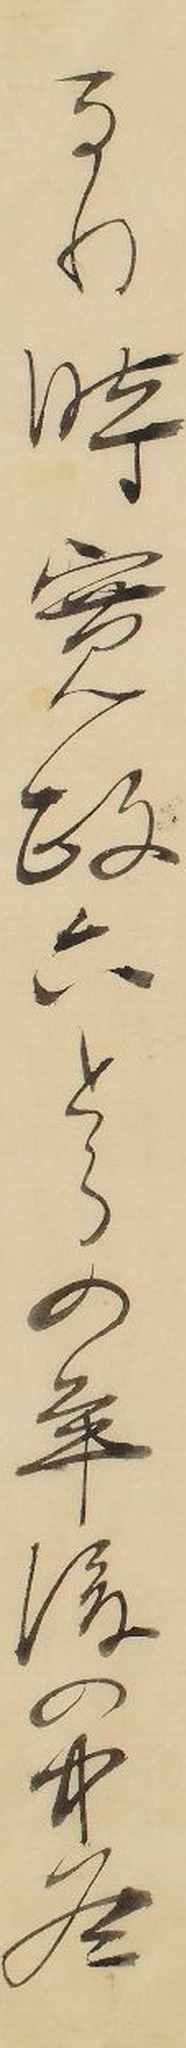なり時寬政六とらの年後の中冬
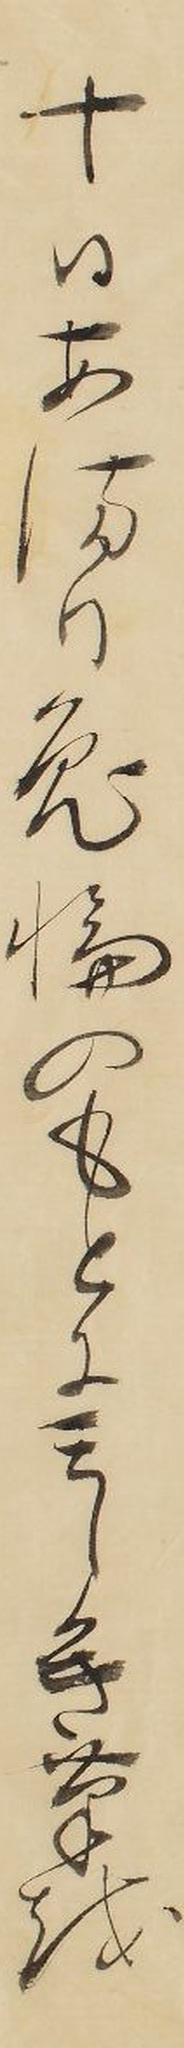十日あまり兎輪のもとにみしかき草を
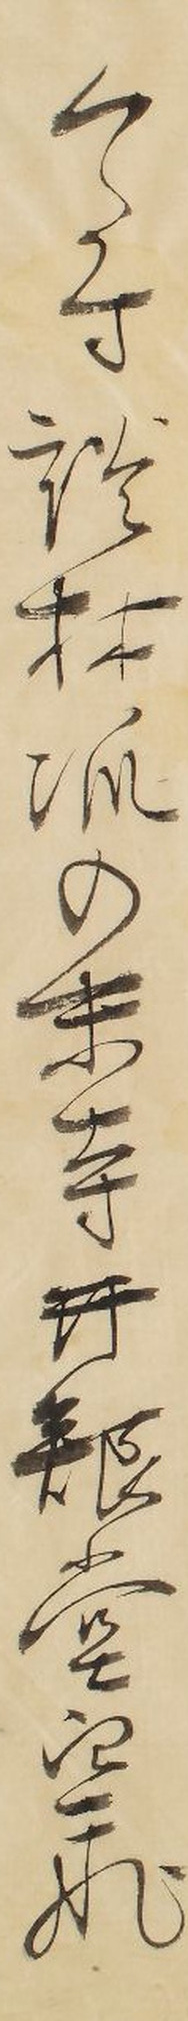くたす談林派の末寺井艱堂竄
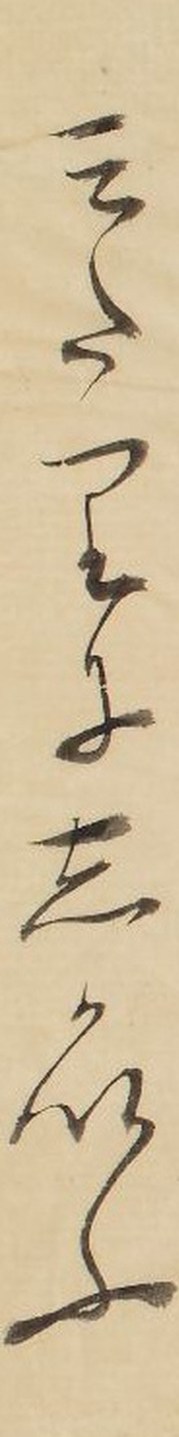みたりにしかいふ
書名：花土産
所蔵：徳島県立図書館
